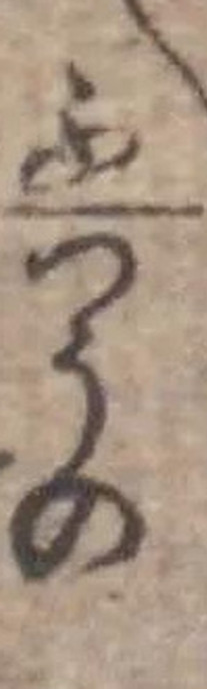ふつうの
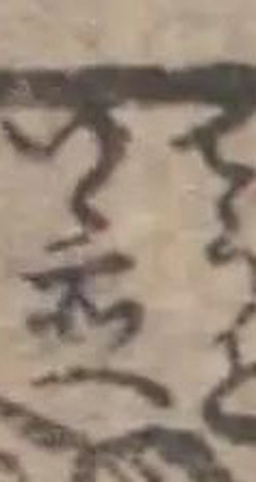いゝ所へ
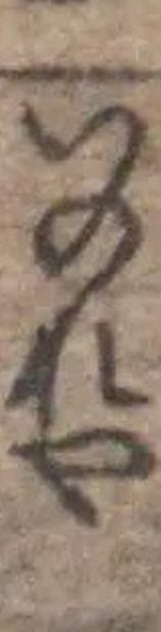いのれや
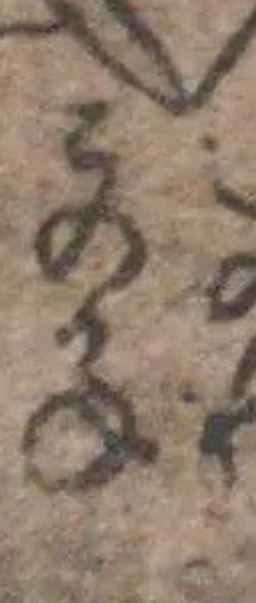このかね
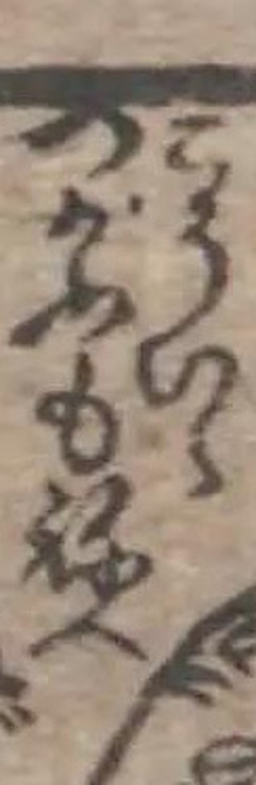つがふもねへ
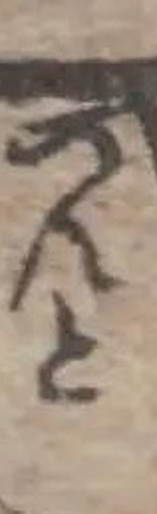「つんと
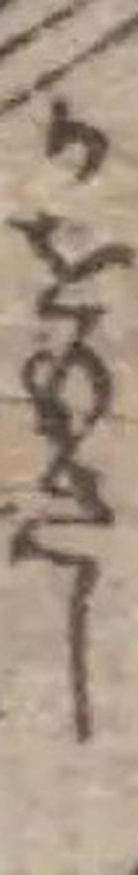かをもさし
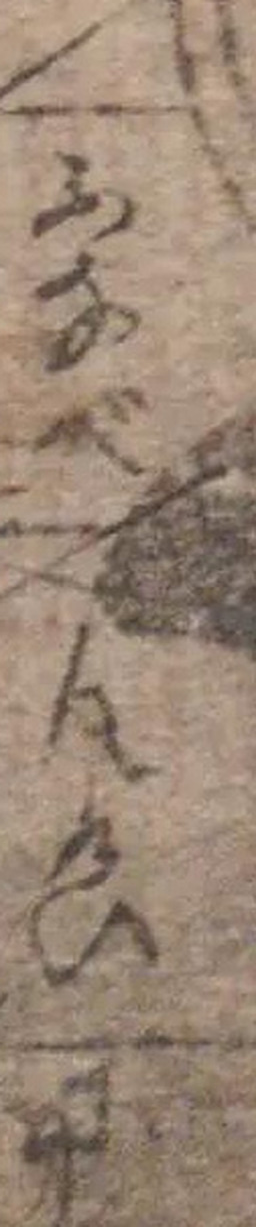ふなべんけいに
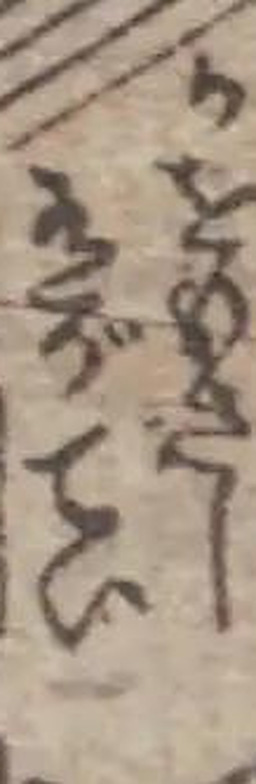有がてい
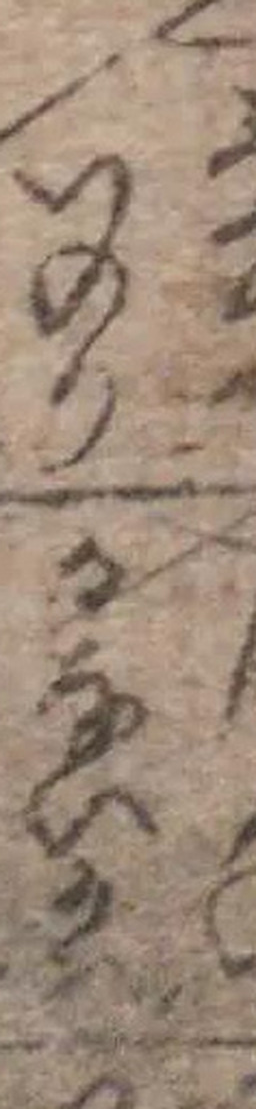いのれ
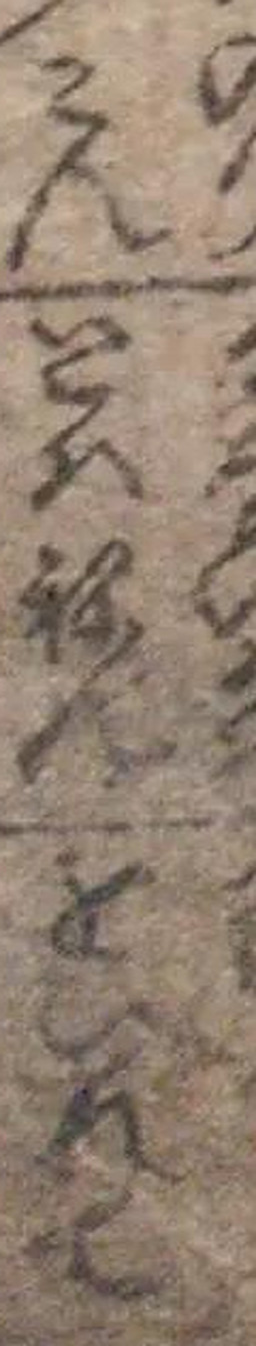こんとはねんをいれて
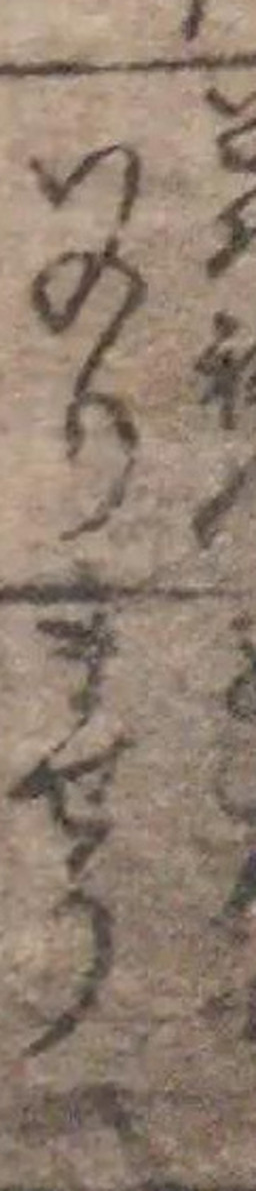いのりませう

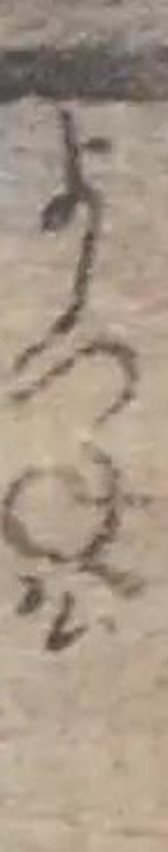よしつね公
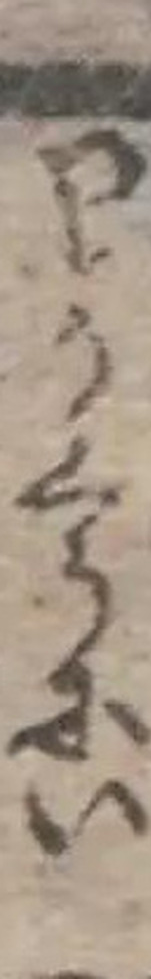りうくうにい
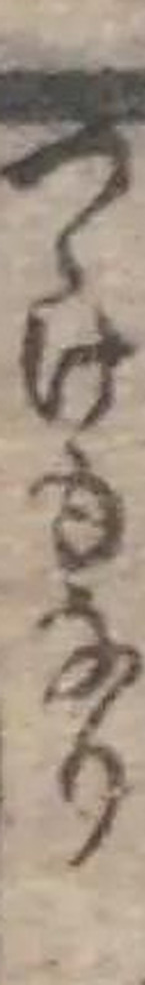つゝけもなり
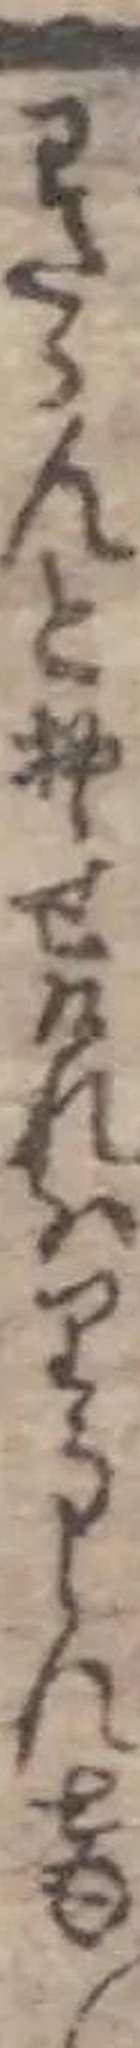わたらんとおゝせけれハりうしんとも
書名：草紙の曙 3巻
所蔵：国立国会図書館 National Diet Library, JAPAN
